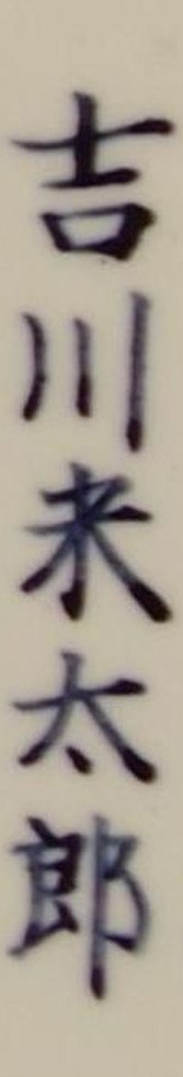吉川米太郎
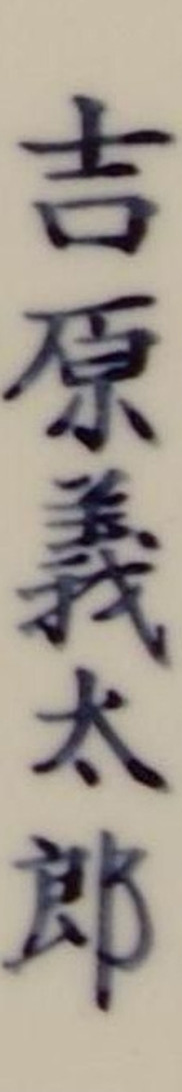吉原義太郎
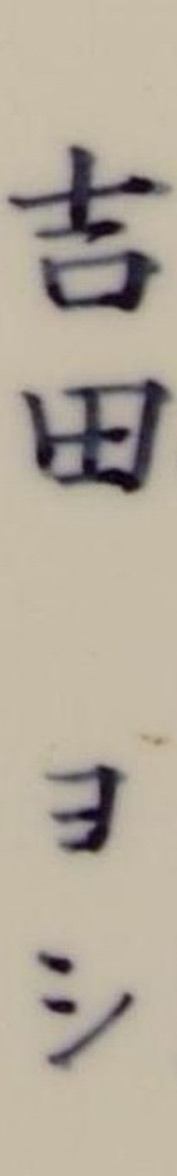吉田ヨシ
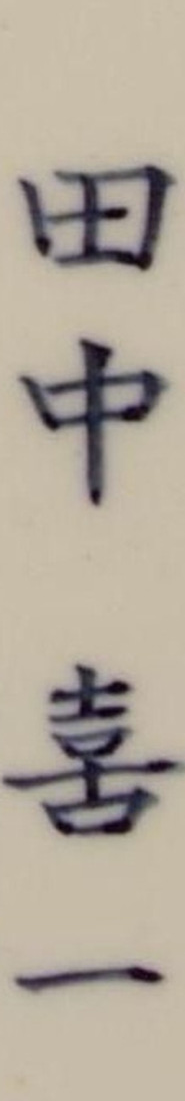田中喜一
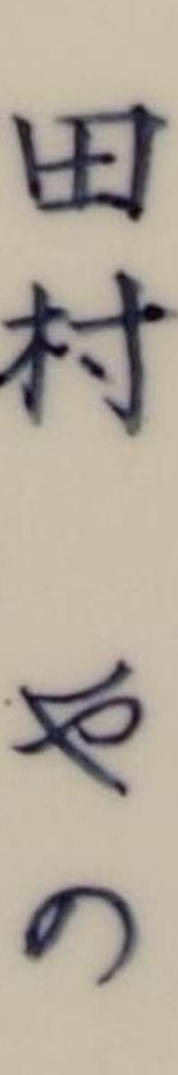田村やの
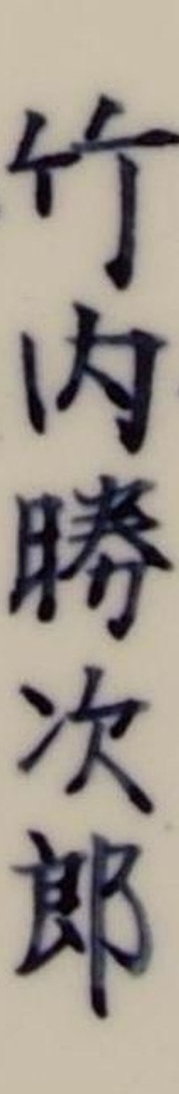竹内勝次郎
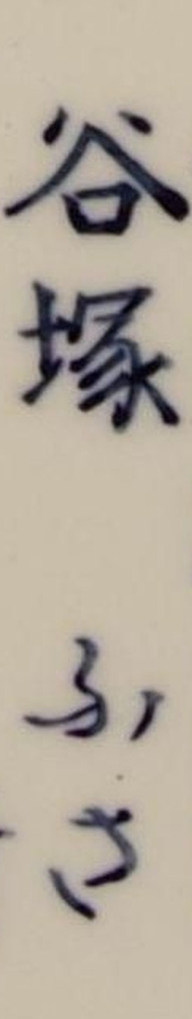谷塚ふさ
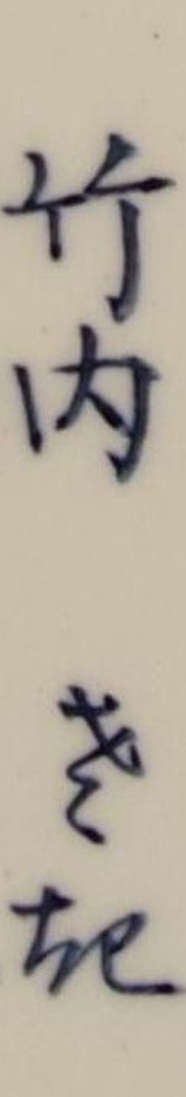竹内さき
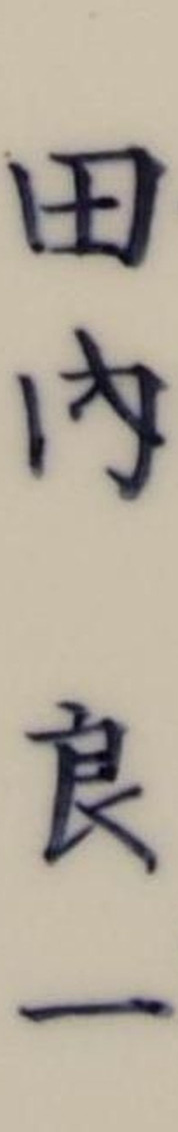田内良一
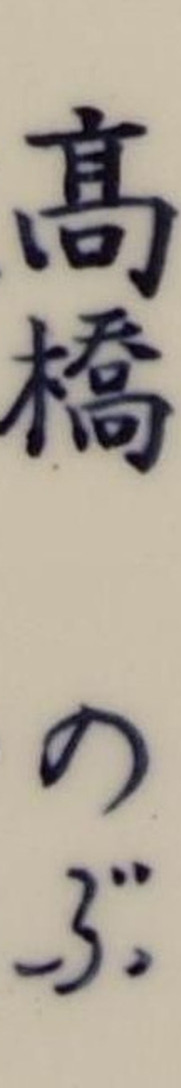高橋のぶ
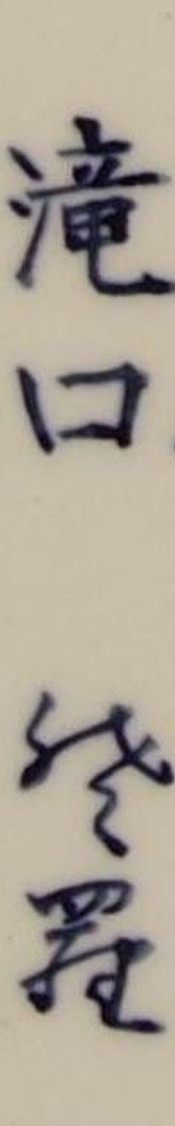滝口そ羅
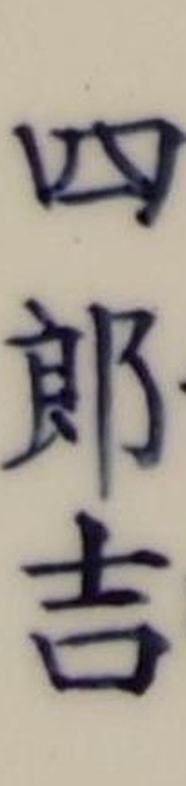四郎吉

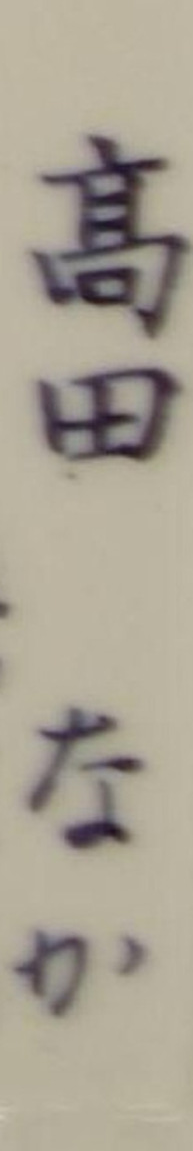高田なか
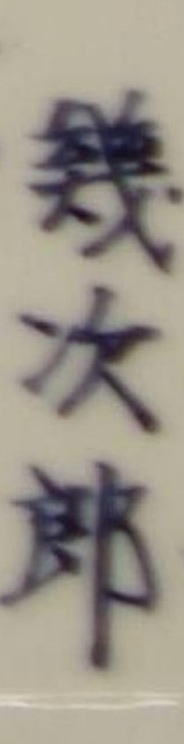幾次郎
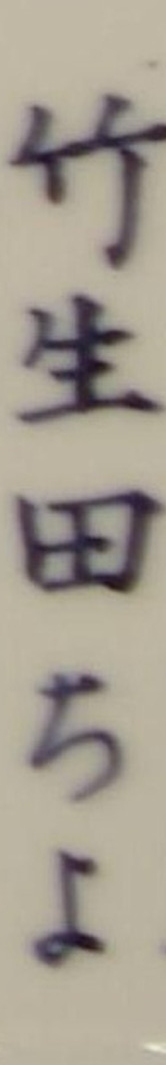竹生田ちよ
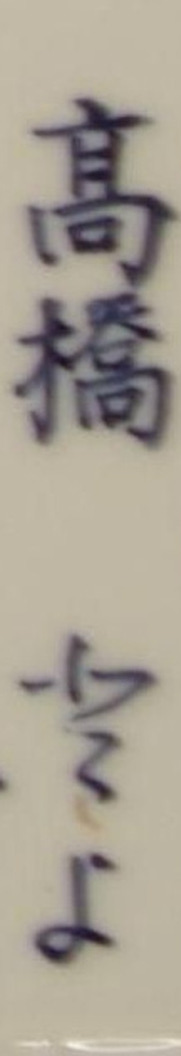高橋とよ
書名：E~L
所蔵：高野山金剛峯寺
